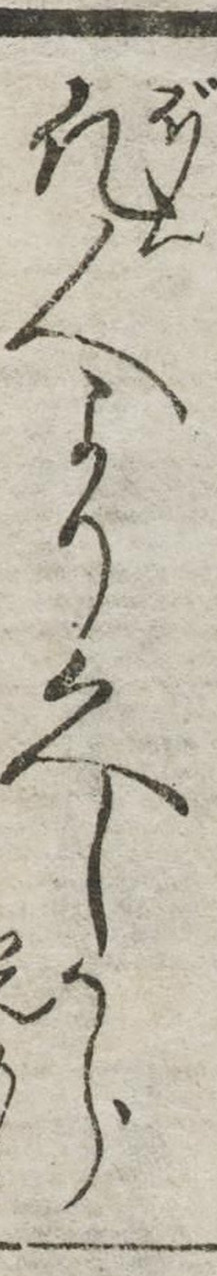凡人より久しから
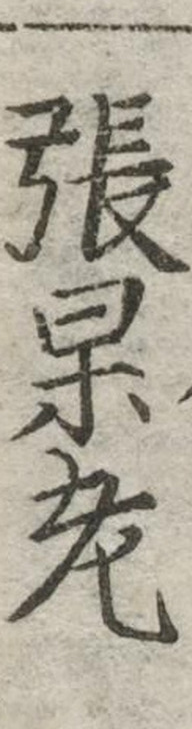張果老
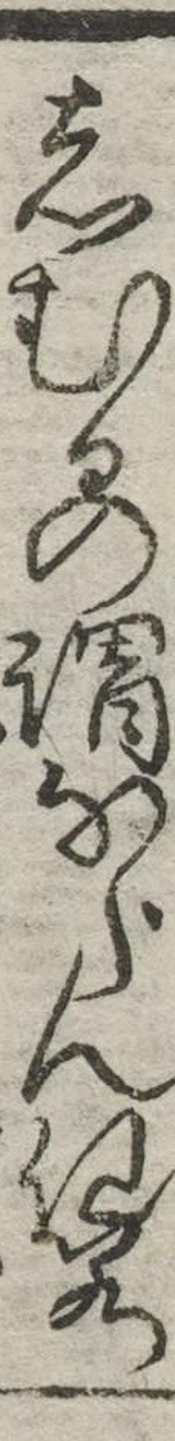しむるの謂ならん仙若
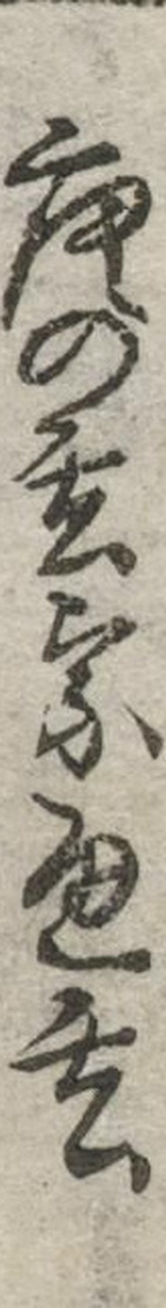唐の玄宗通玄
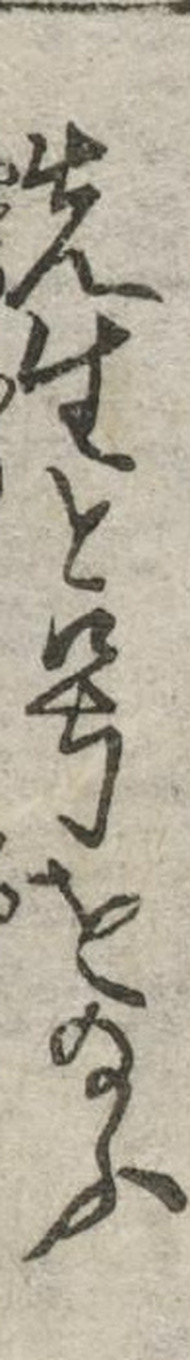先生と号を給ふ
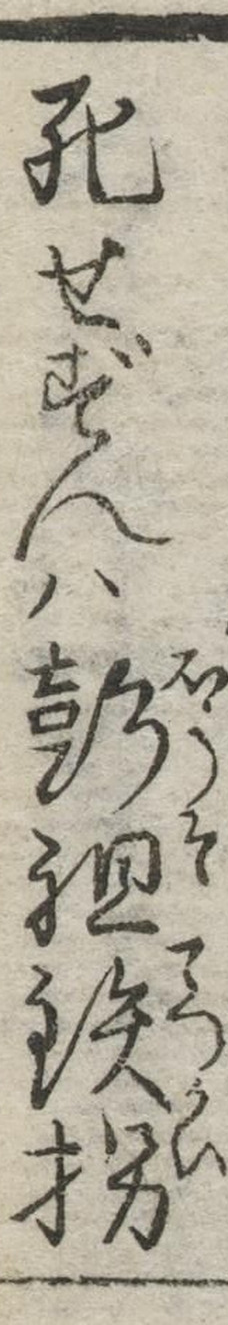死せずんは彭祖鉄拐
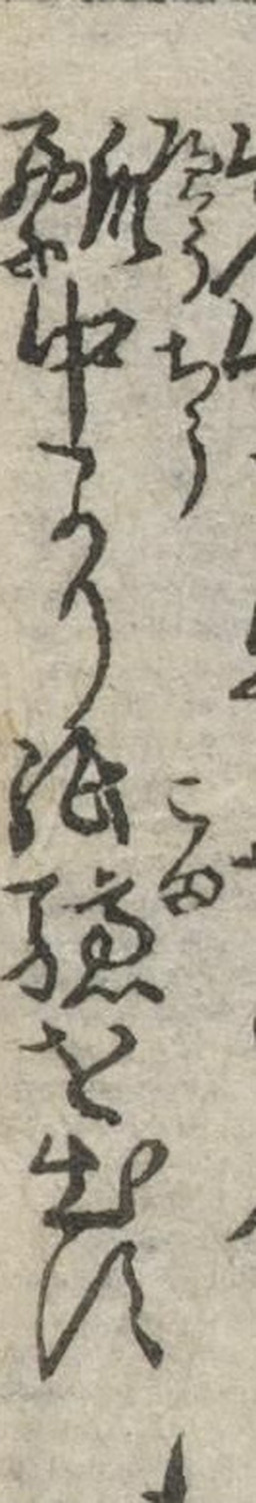瓢中より神驢を出す

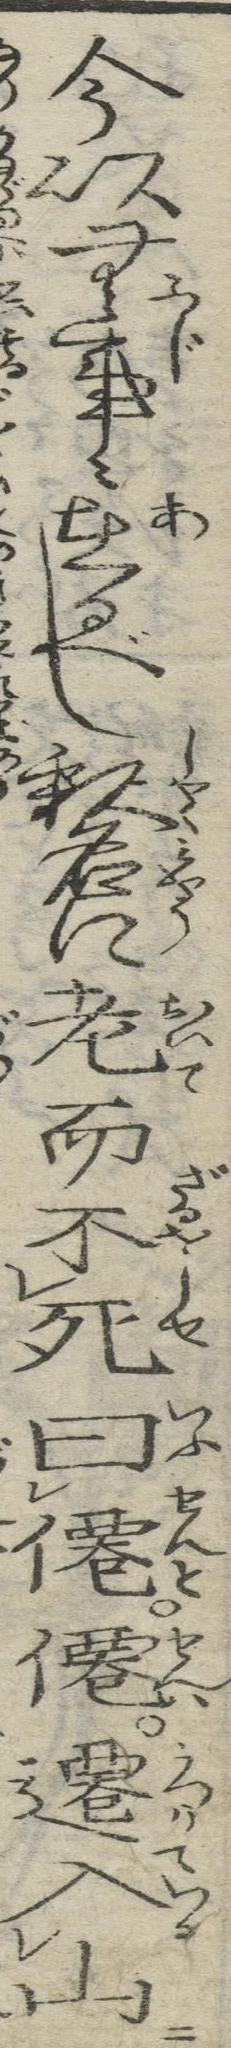今以無事に在るべし釈名に老而不死曰僊。遷入山二
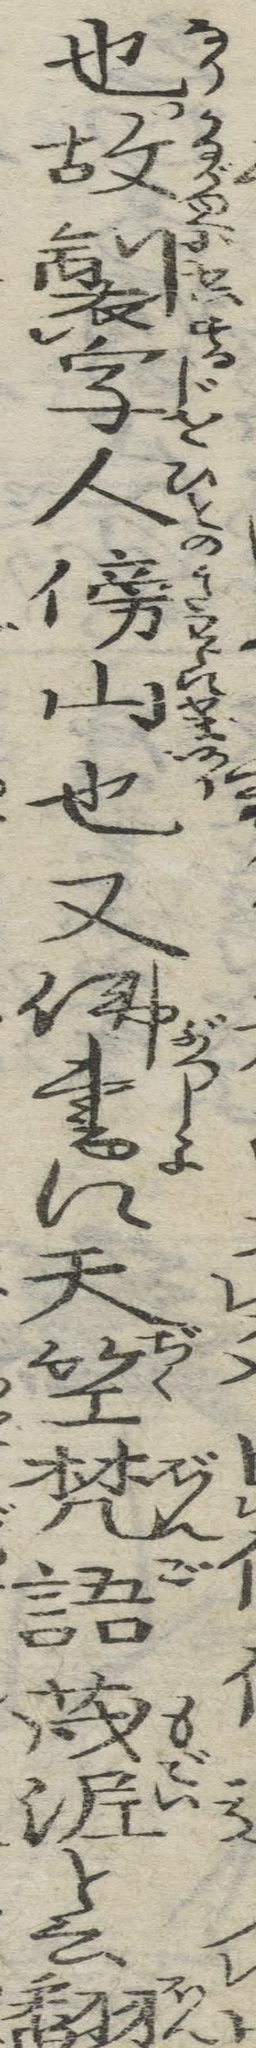也。故製字人傍山也。又佛書に天竺梵語茂泥と云翻
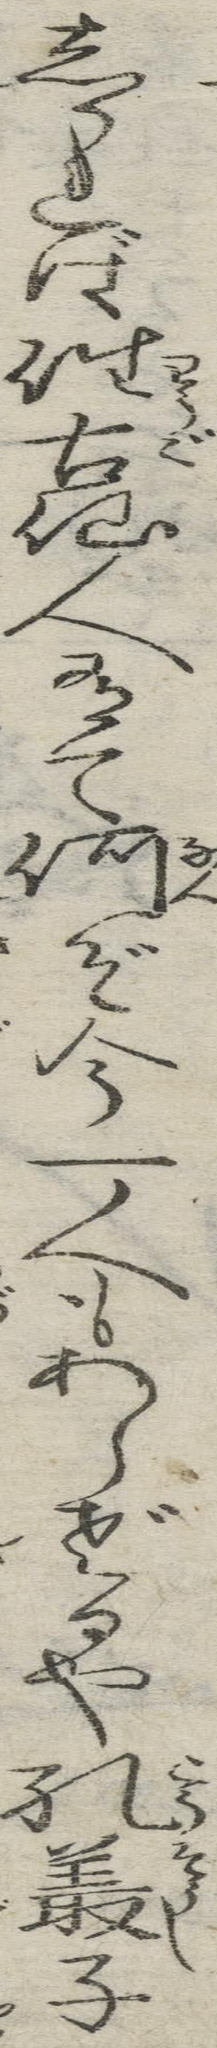しかれば往古仙人有って何ぞ今一人もあらずるや孔叢子
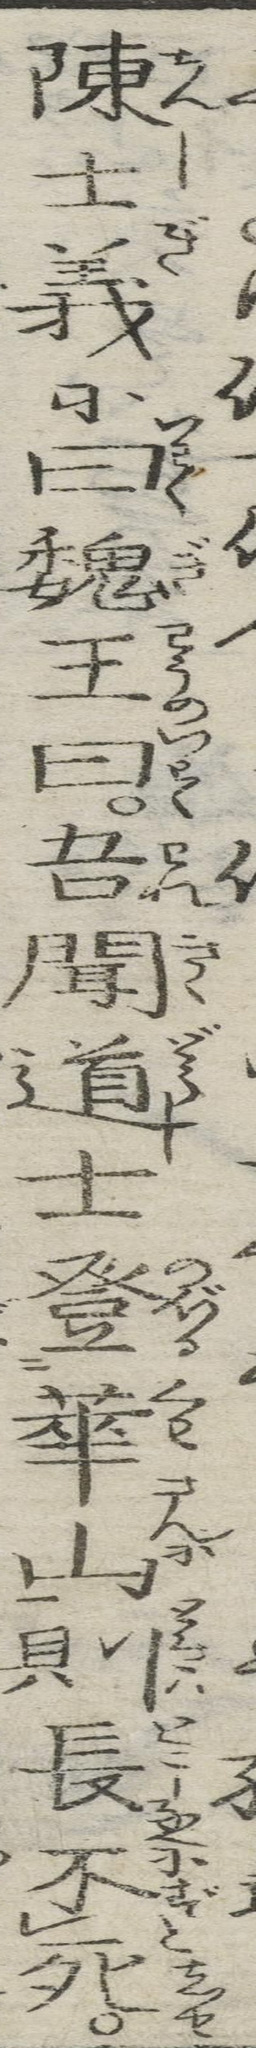陳士義に曰魏王曰。吾聞道士登華山則長不死。
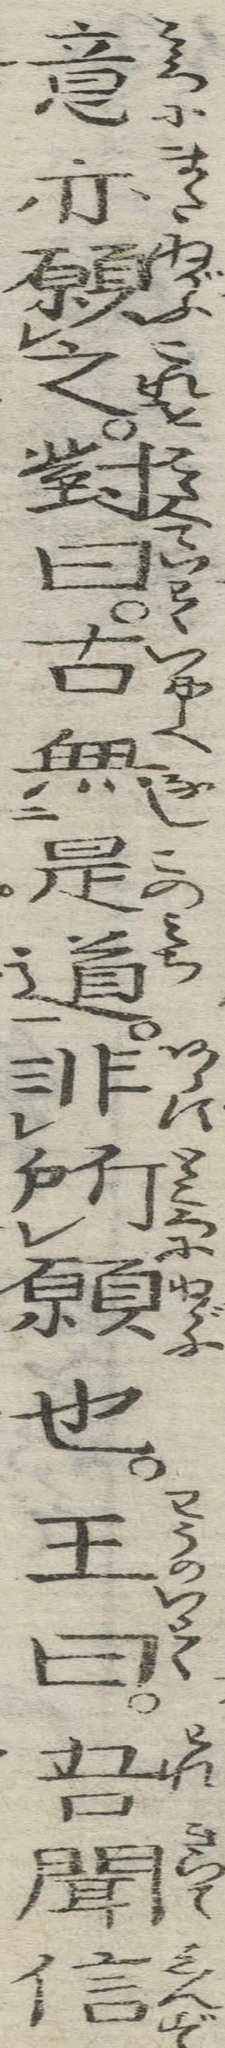意亦願之。對曰。古無是道。非所願也。王曰。吾聞信
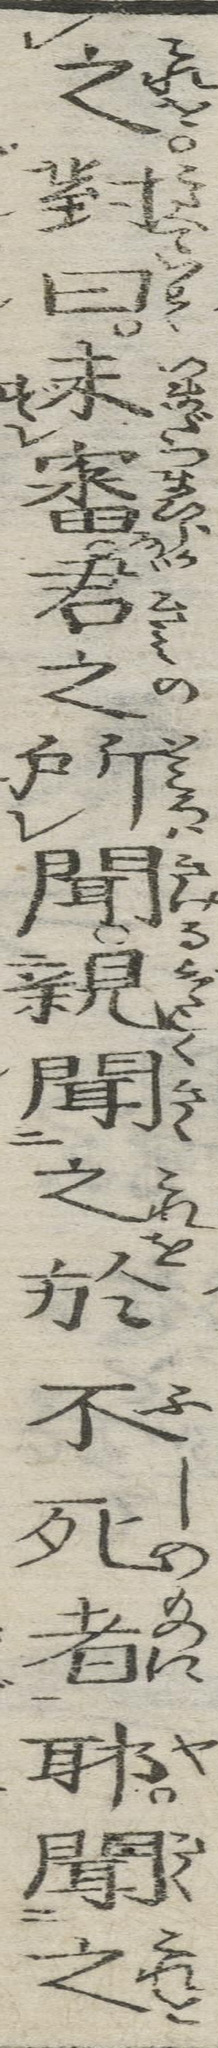之。對曰。未ず審。君之所聞。親聞之於不死者耶。聞之
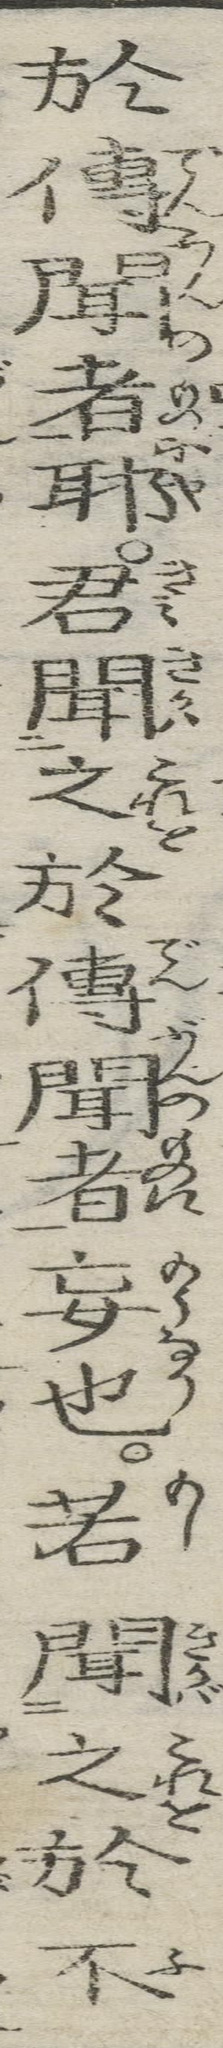於伝聞者耶。君聞之於伝聞者妄也。若聞之於不
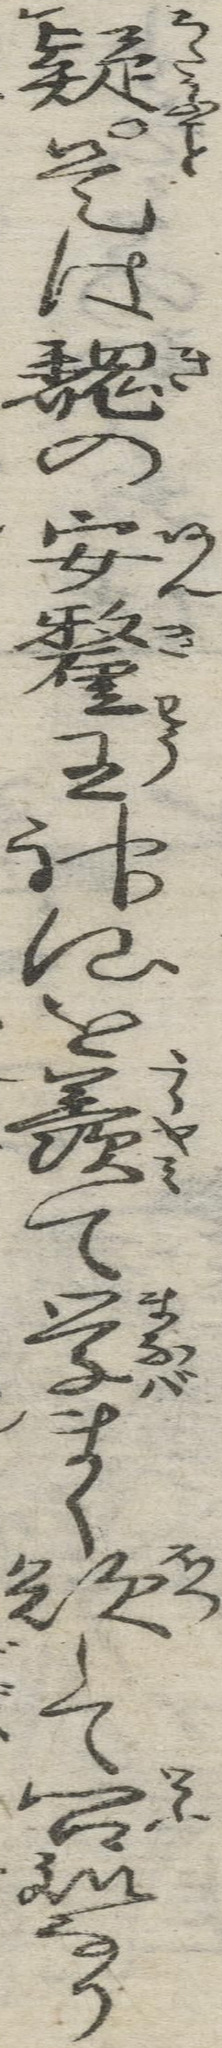疑。是は魏の安釐王神仏を羨て学まく欲して問処なり
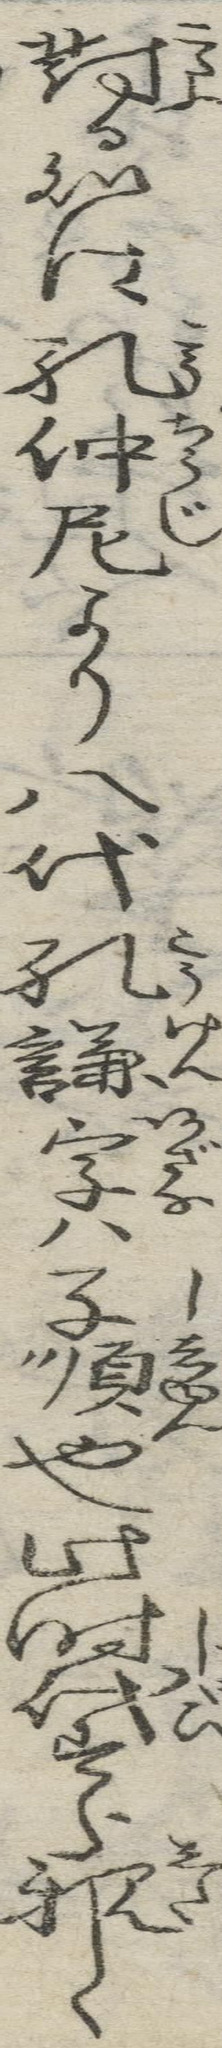對る処は孔仲尼より八代孔謙字は子順也此時代すら親しく
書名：訓蒙天地辨　人
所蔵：東京大学地震研究所図書室 Earthquake Research Institute Library, The University of Tokyo, JAPAN
